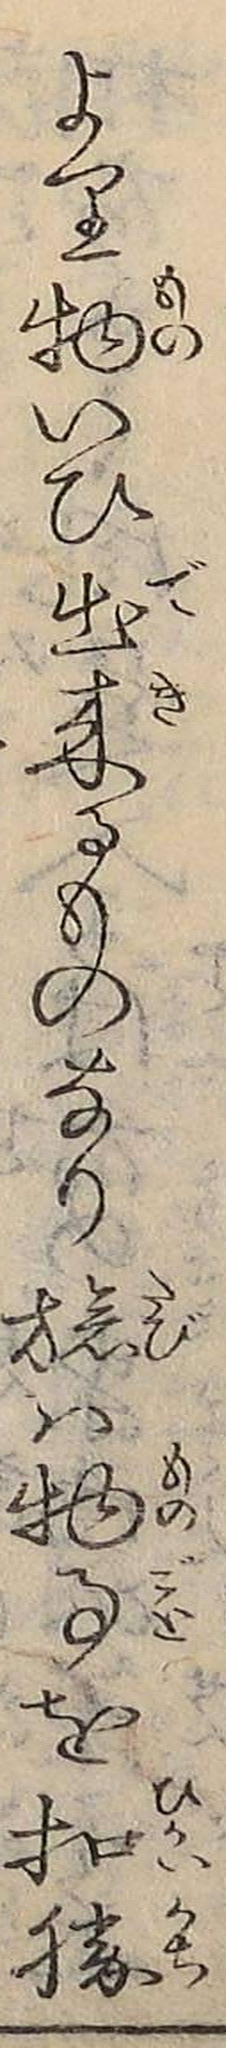より物いひ出来るものなり旅は物事を扣勝
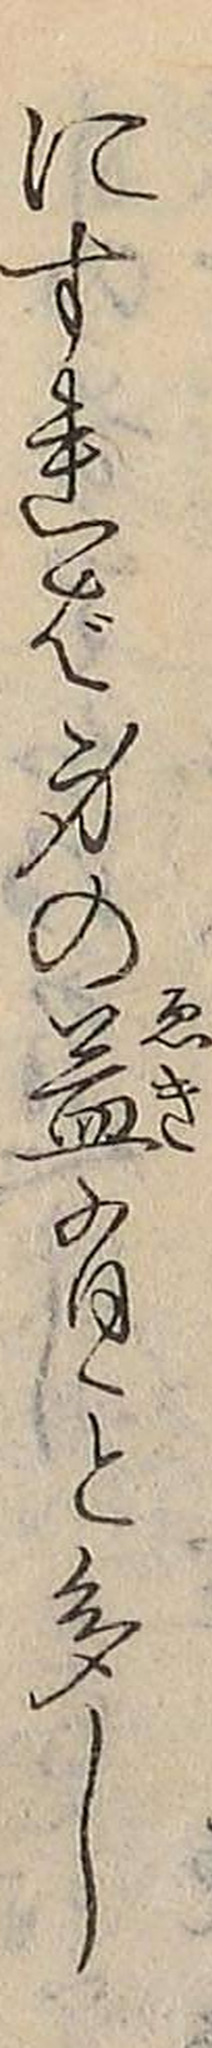にすれば身の益有こと多し
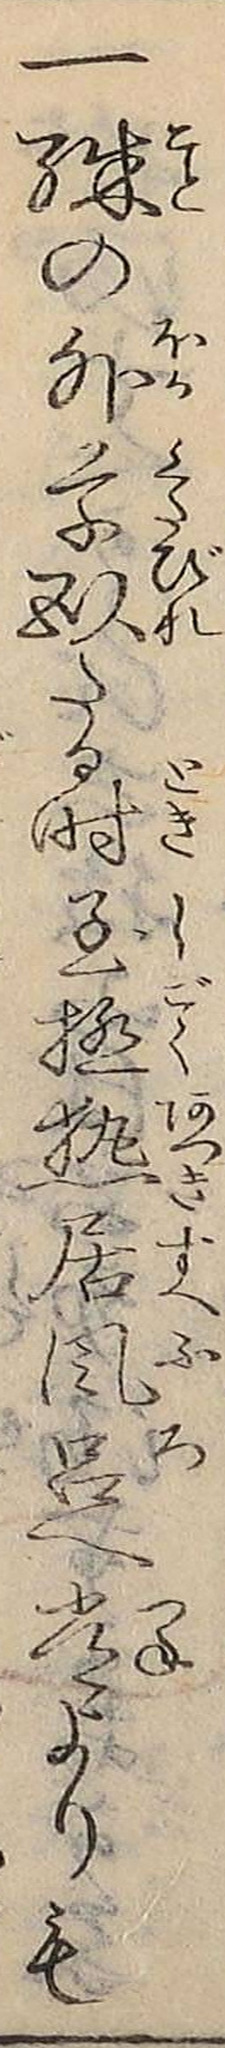一殊の外草臥たる時至極熱居風呂へ常よりも
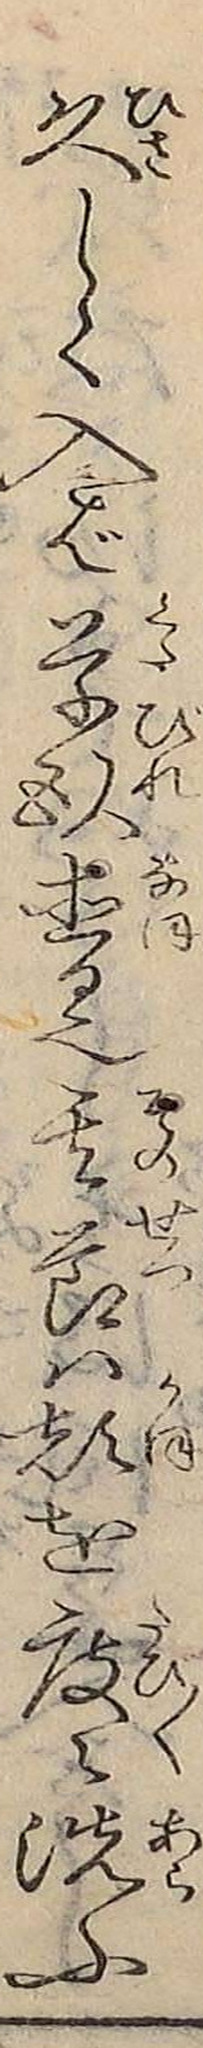久しく入ば草臥直る也其節は顔を度々洗ふ
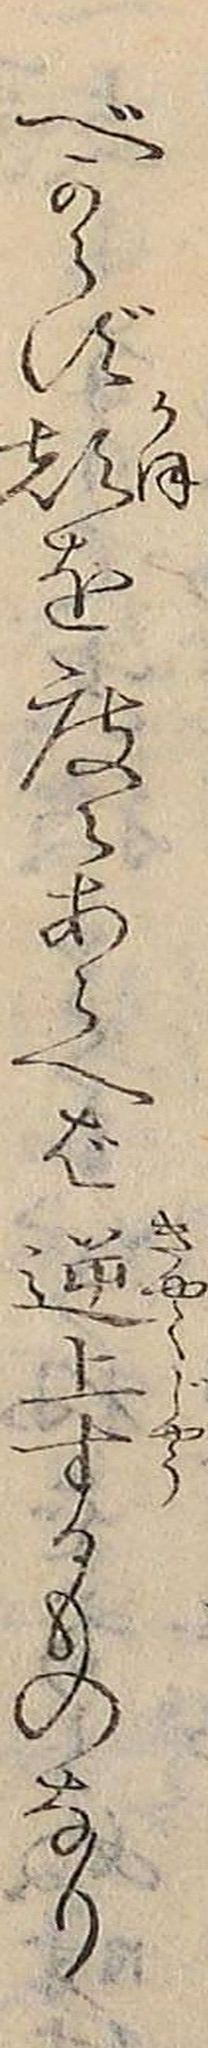べからず顔を度々あらへば逆上するものなり
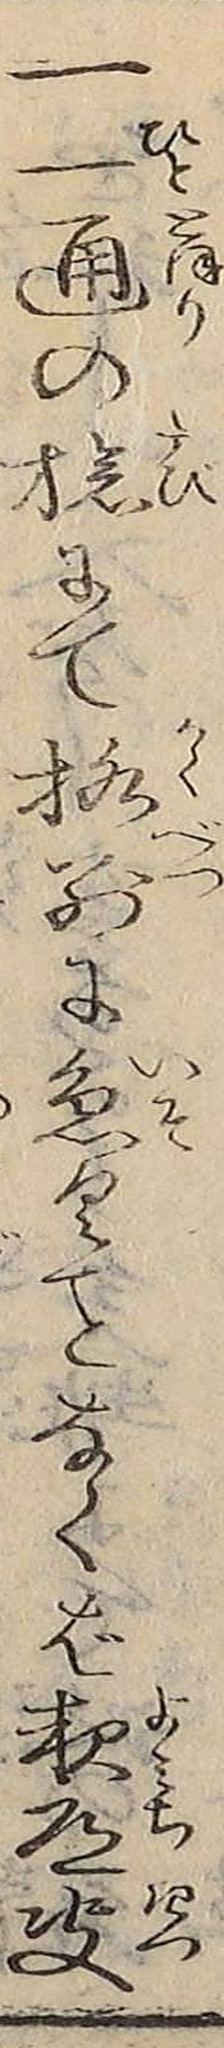一一通の旅にて格別に急くことなくば夜道決
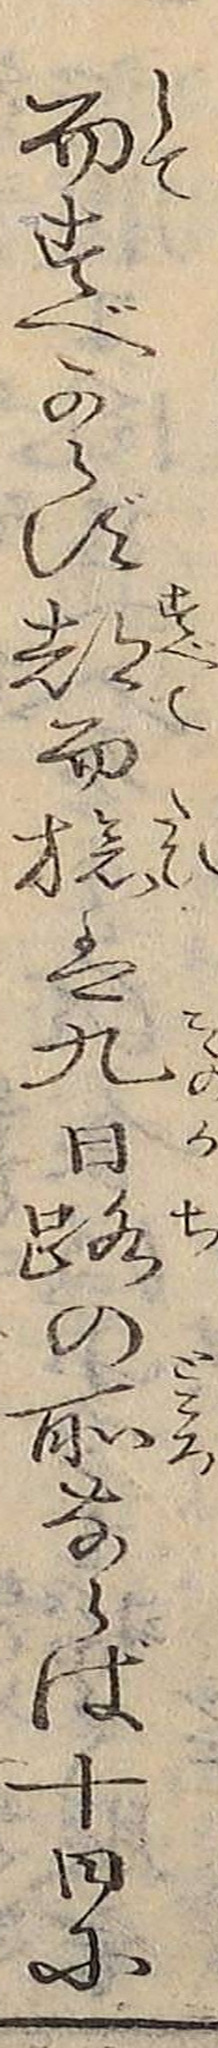而すべからず都而旅は九日路の所ならば十日に
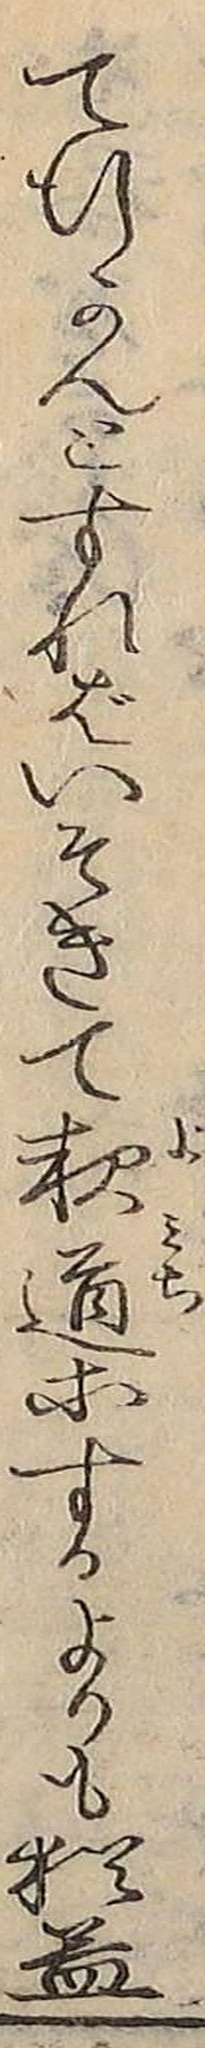て行かんとすればいそきて夜道等するよりも猶益
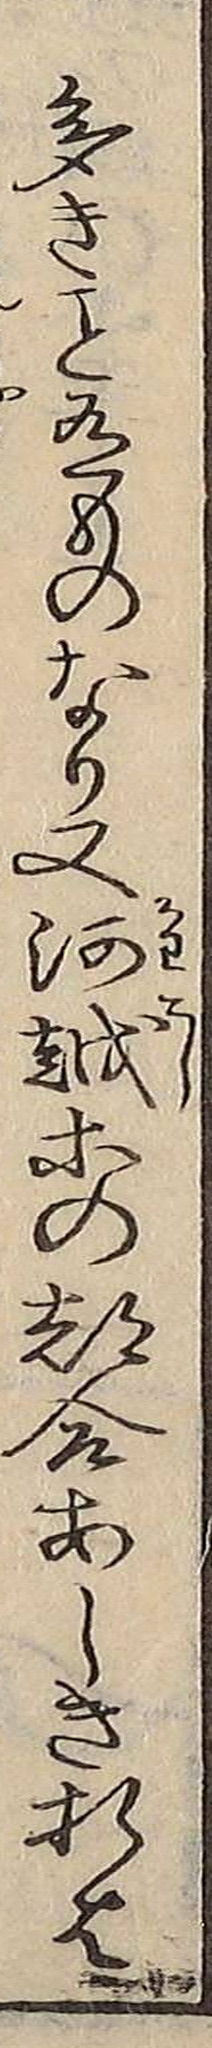多きこと有ものなり又河越等の都合あしき折は
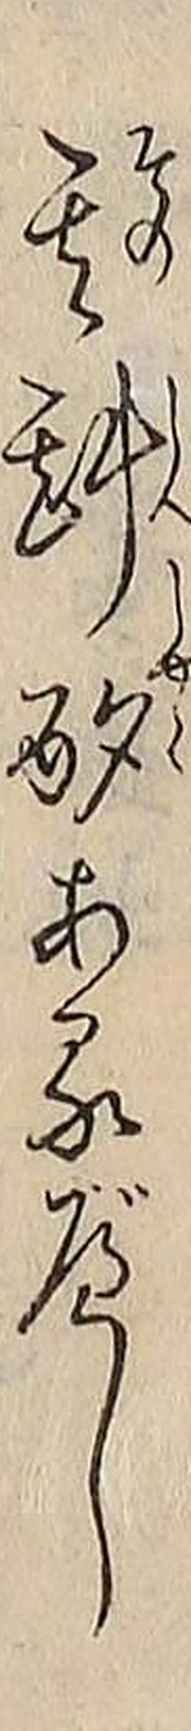其斟酌あるべし
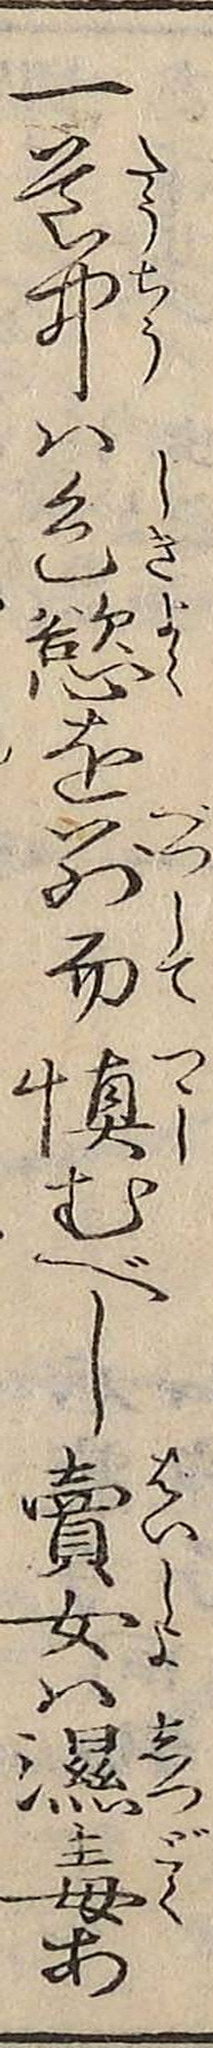一道中は色慾を別而慎むべし売女は湿毒あ
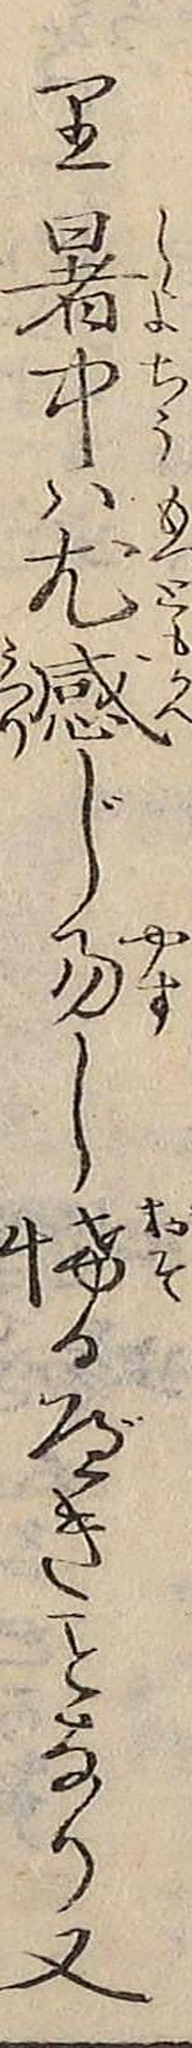り暑中は尤感じ易し怖るべきことなり又
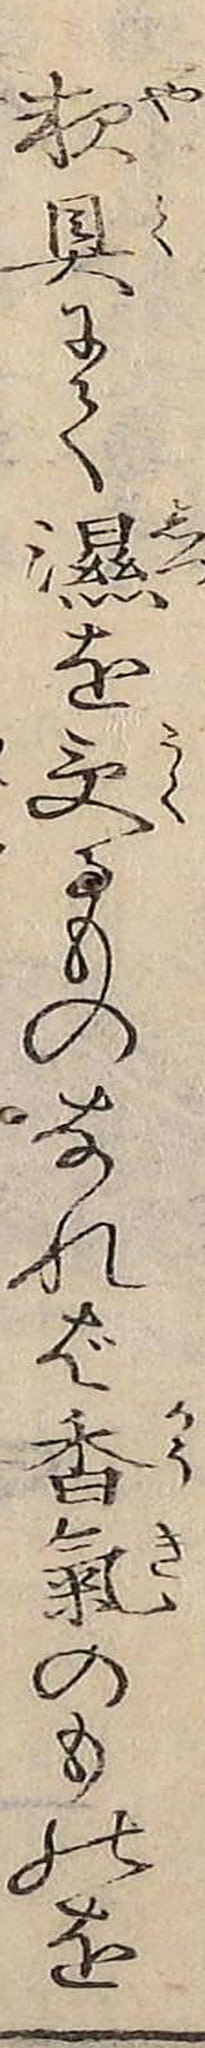夜具にて湿を受るものなれば香気のものを
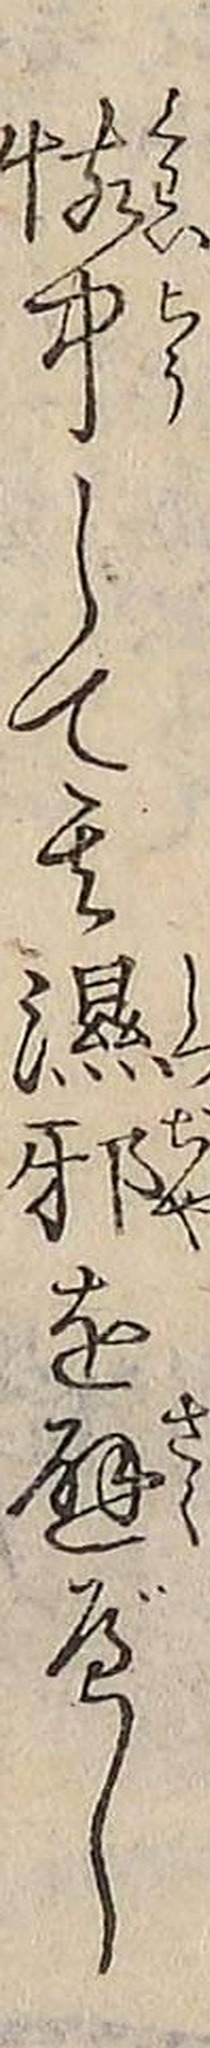懐中して其湿邪を避べし
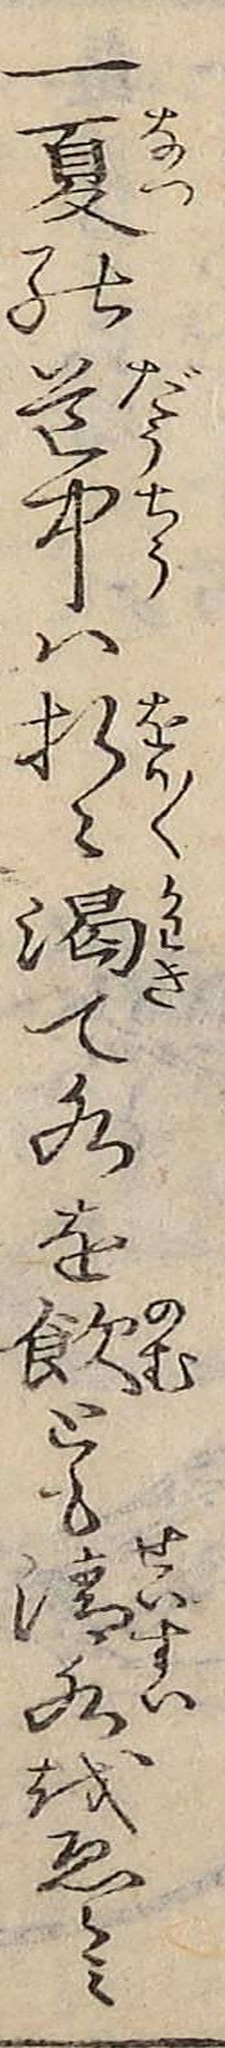一夏の道中は折々渇て水を飲とも清水をゑらみ
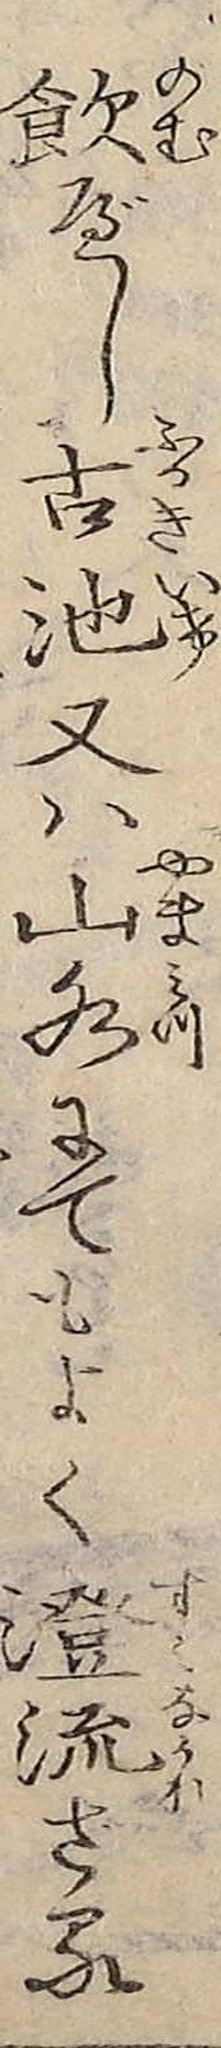飲べし古池又は山水にてもよく澄流ざる
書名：旅行用心集
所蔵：神戸大学附属図書館 国文学研究資料館
